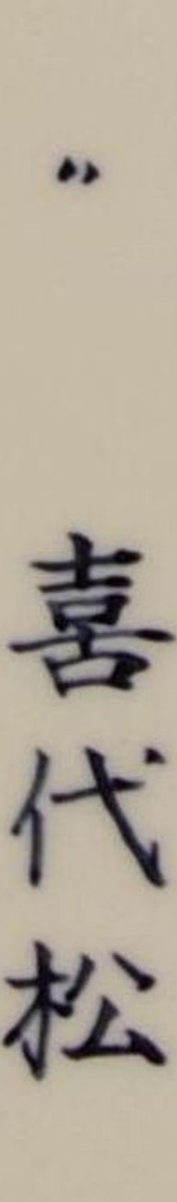喜代松
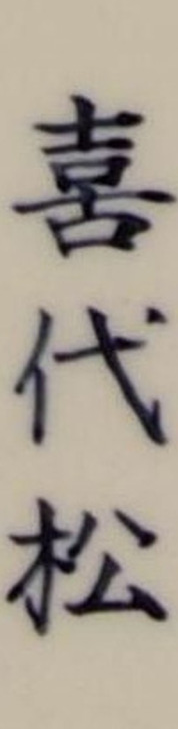喜代松
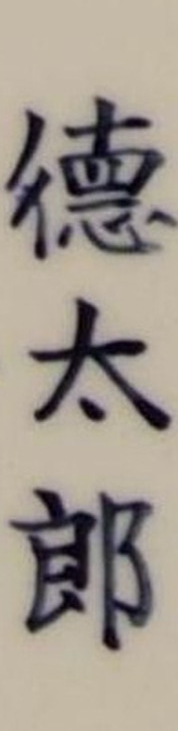徳太郎
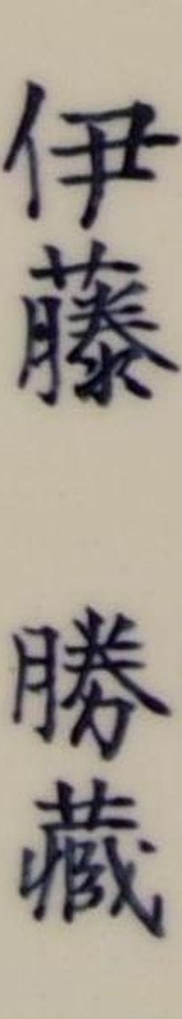伊藤勝藏

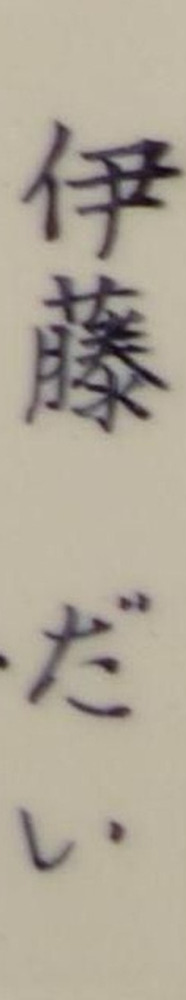伊藤だい
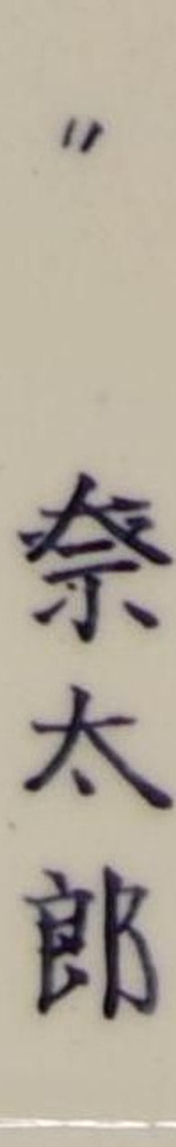奈太郎
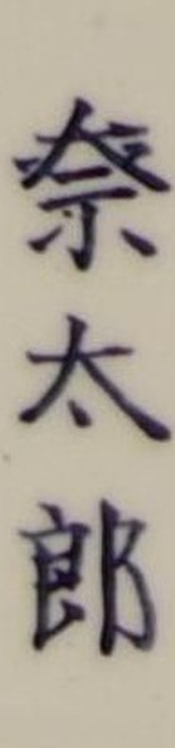奈太郎
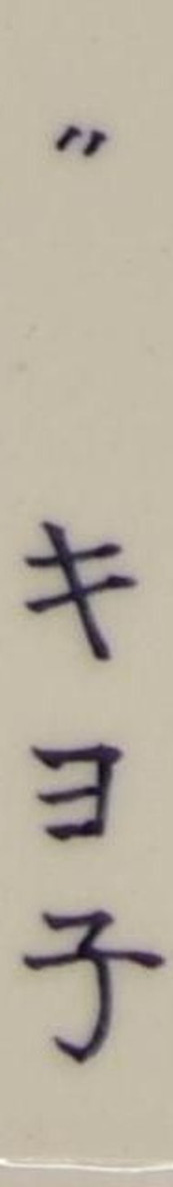キヨ子
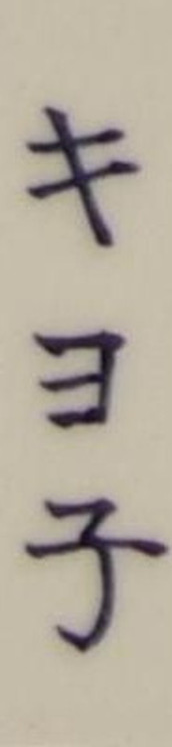キヨ子
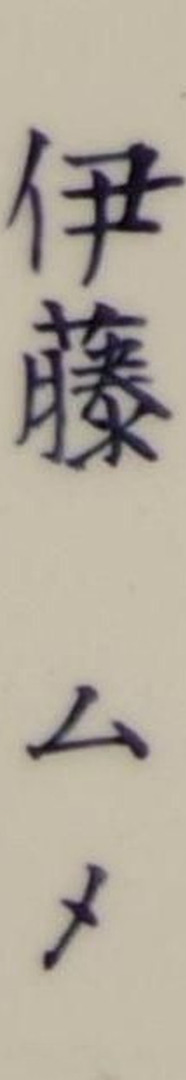伊藤ムメ
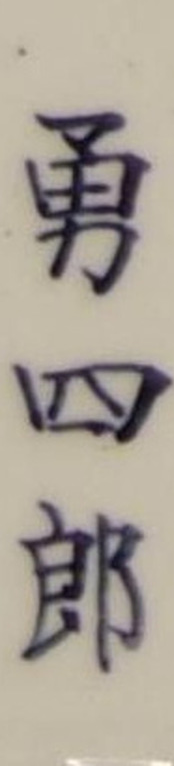勇四郎
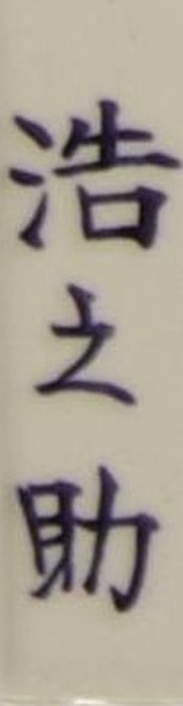浩之助

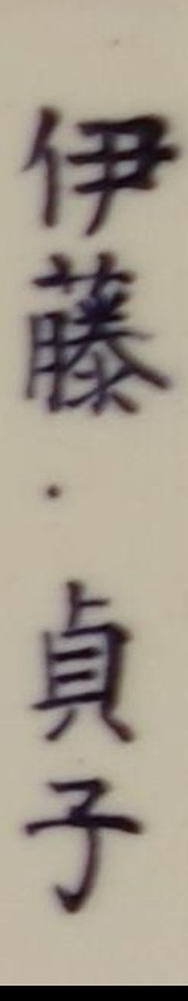伊藤貞子
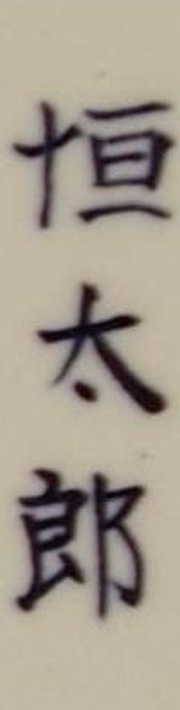恒太郎
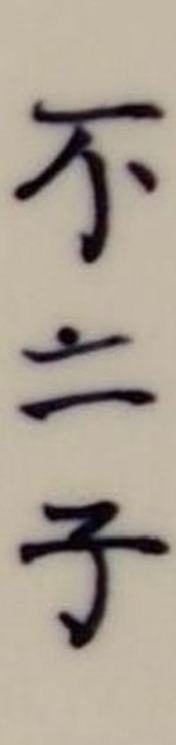不二子
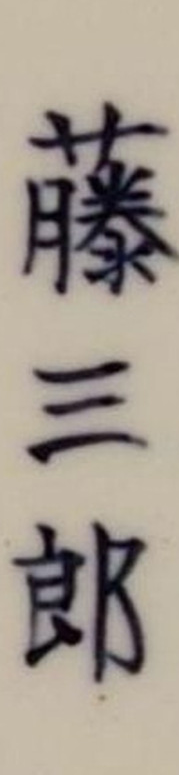藤三郎
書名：M~S
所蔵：高野山金剛峯寺
